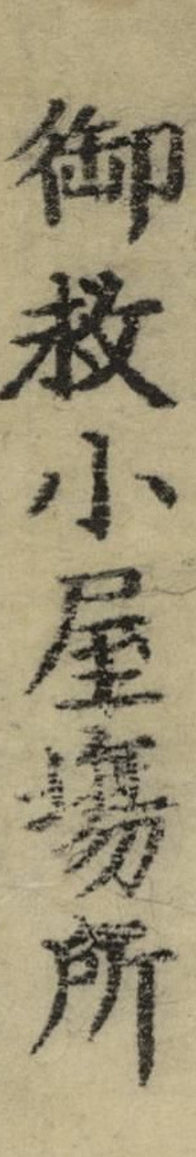御救小屋場所
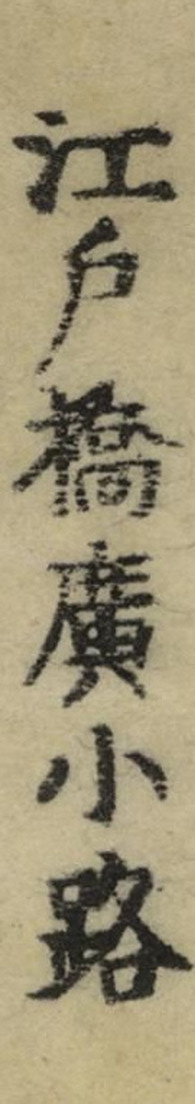江戸橋広小路同
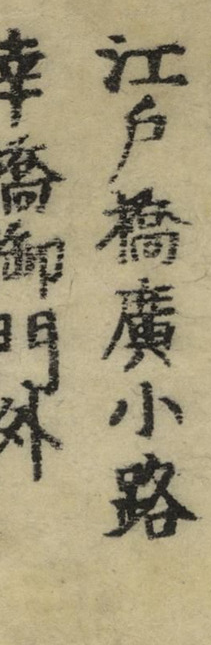江戸橋広小路同
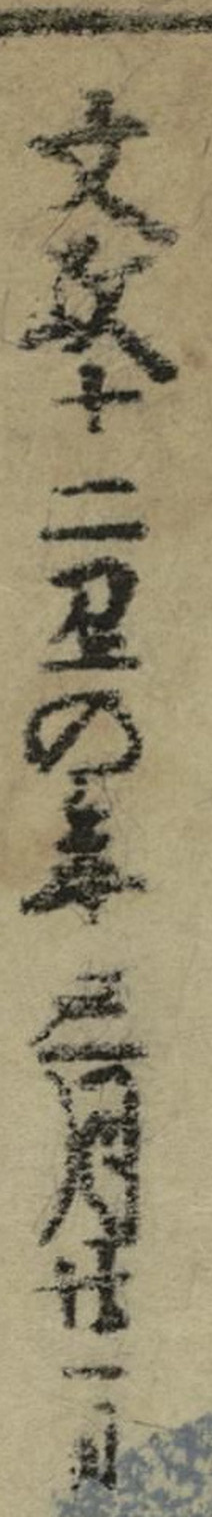文政十二丑の年三月廿一日
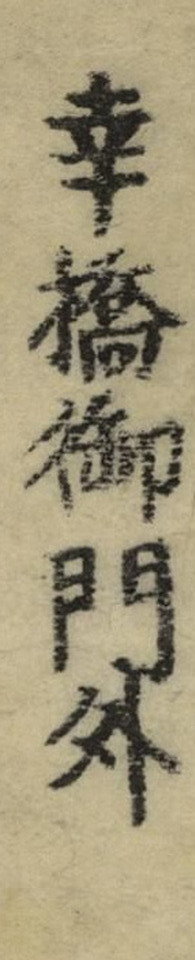幸橋御門外同
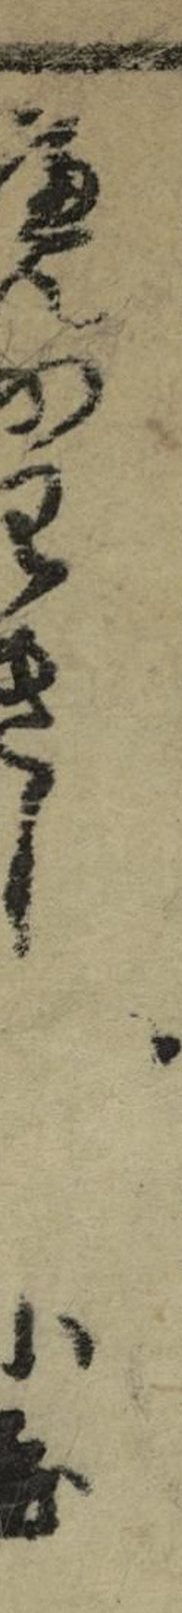へんかわきし小屋
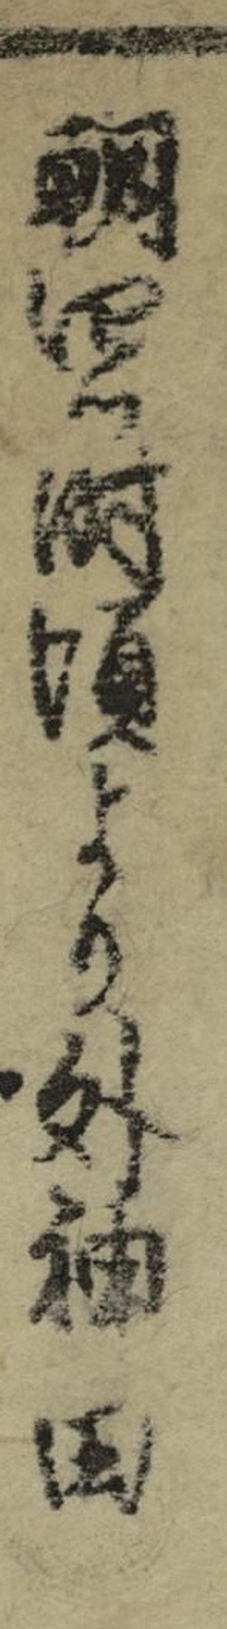朝四ッ時頃より外神田
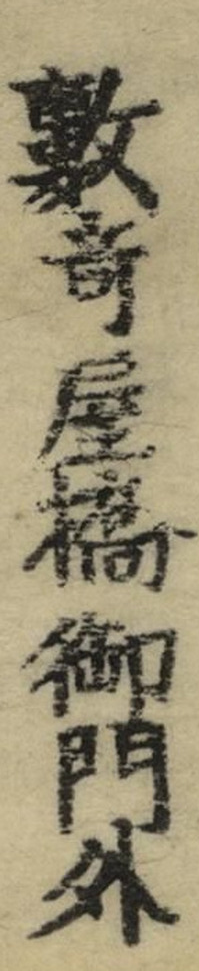数寄屋橋御門外同
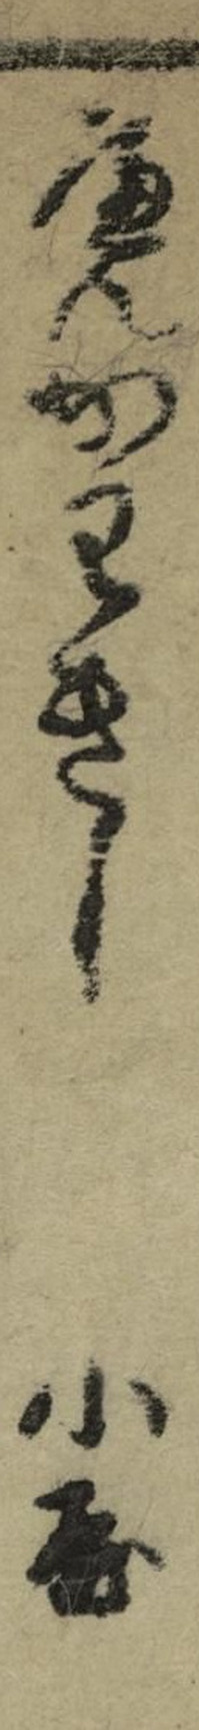へんかわきし小屋
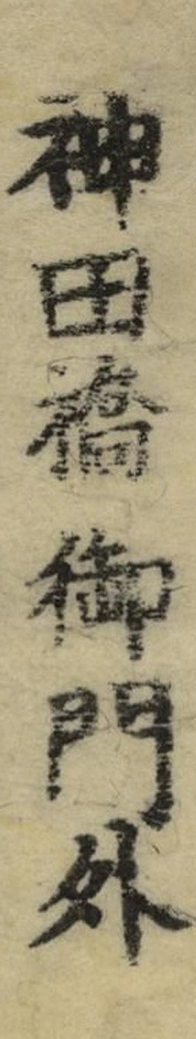神田橋御門外同
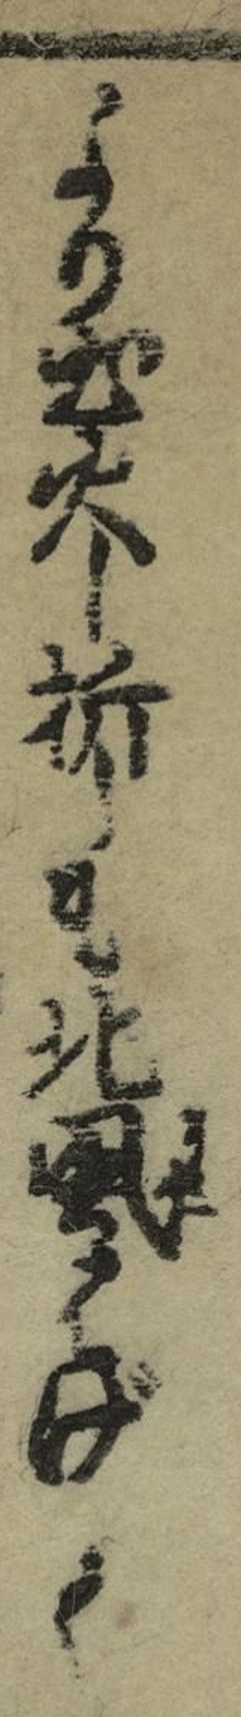より出火し折しも北風はげしく
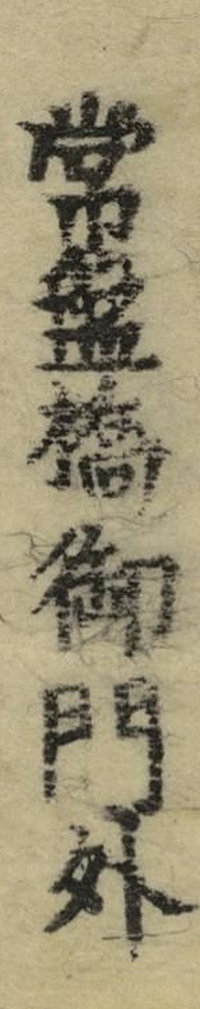常盤橋御門外同
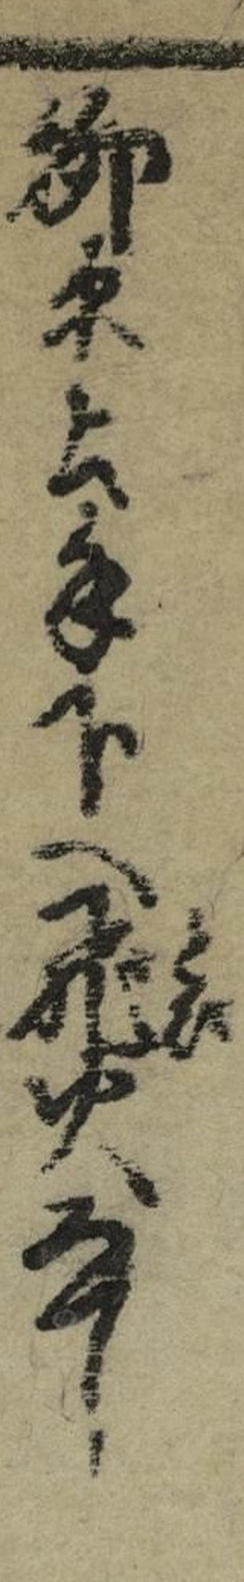柳原土手下へ飛火なし
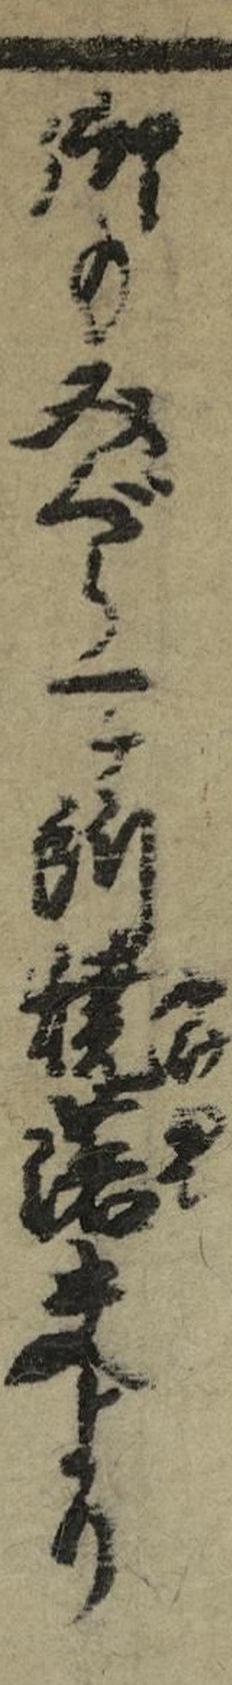御もみぐら一ヶ所焼落夫より
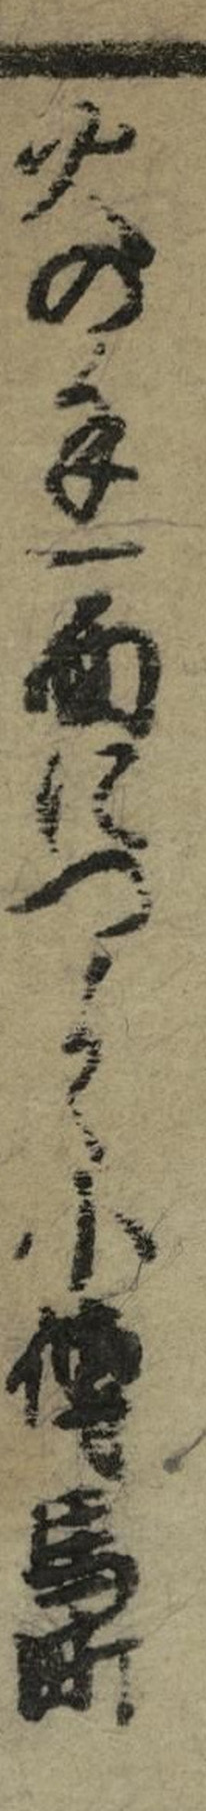火の手一面につゝく小伝馬町
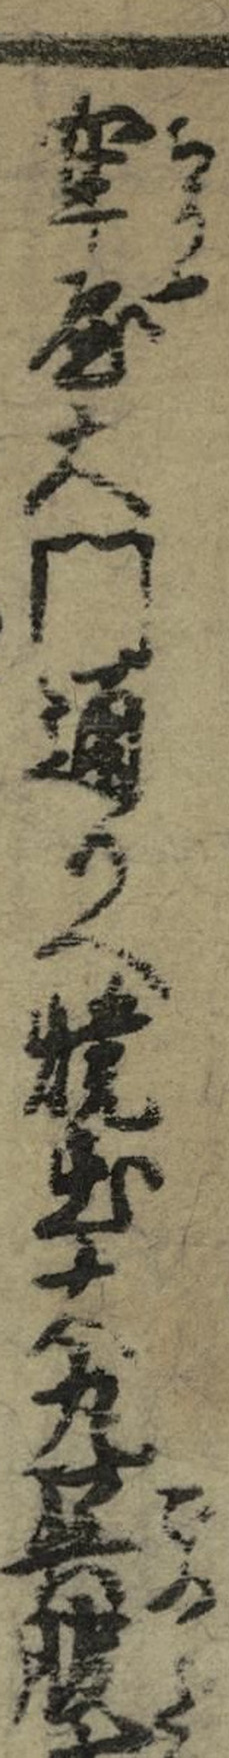牢屋大門通りへ焼出大丸呉服店
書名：[文政十二年三月の江戸大火に関する瓦版]
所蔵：東京大学地震研究所図書室 Earthquake Research Institute Library, The University of Tokyo, JAPAN
